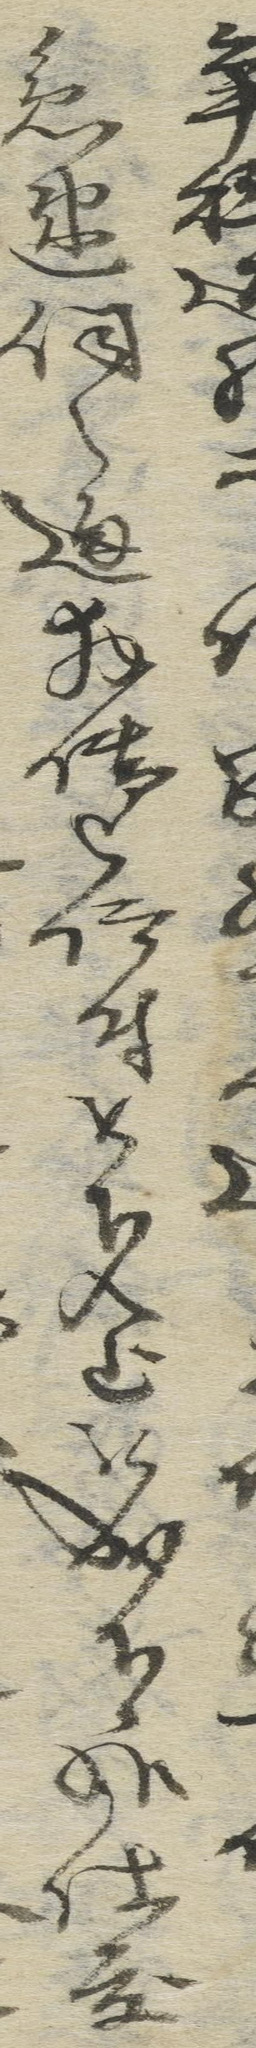急速伺之通拝借被仰付被下置被成下候様仕度
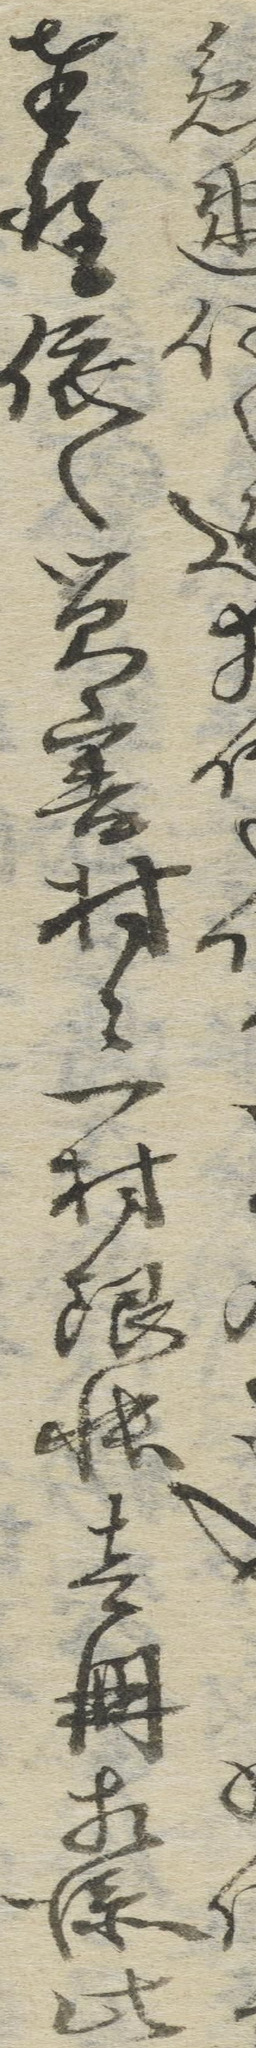奉存候依之災害村々一村限帳壱冊相添此
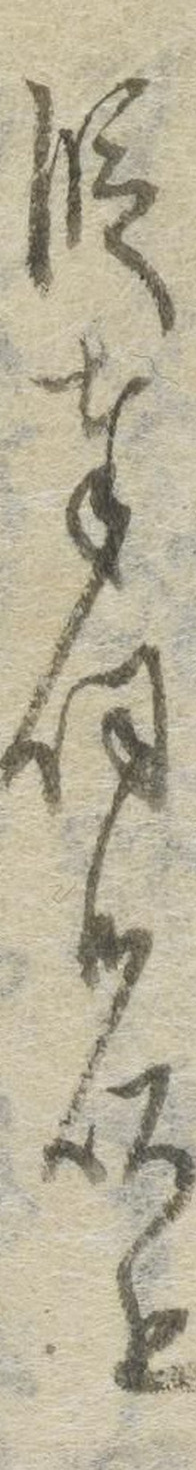段奉伺候以上
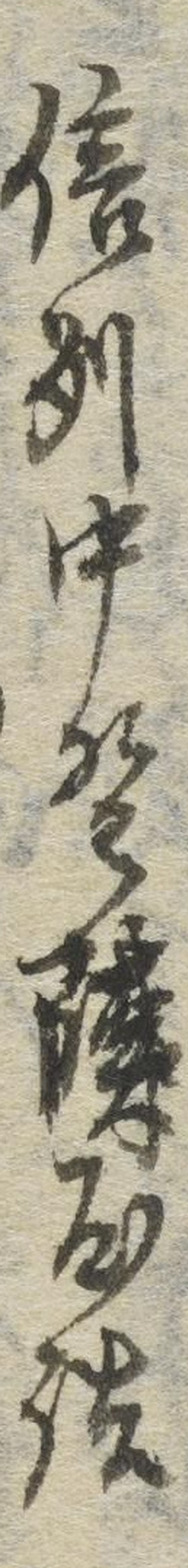信州中野陣屋詰
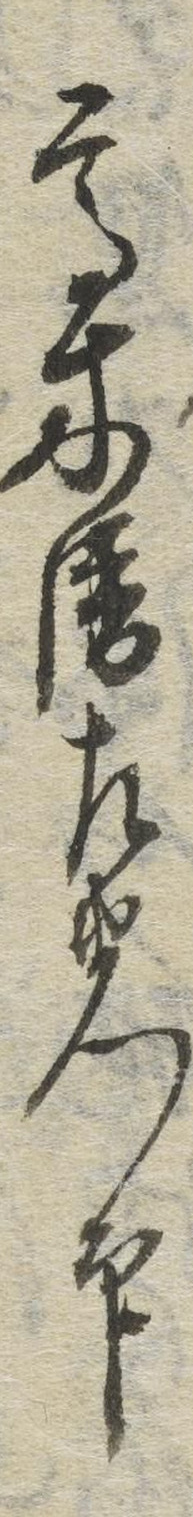高木清左衛門印
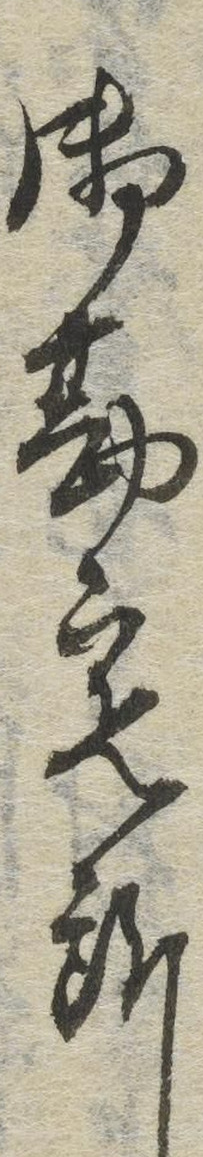御勘定所
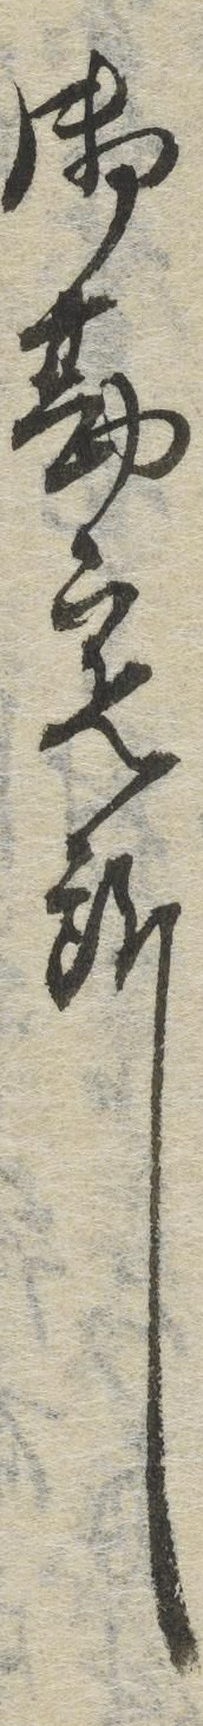御勘定所
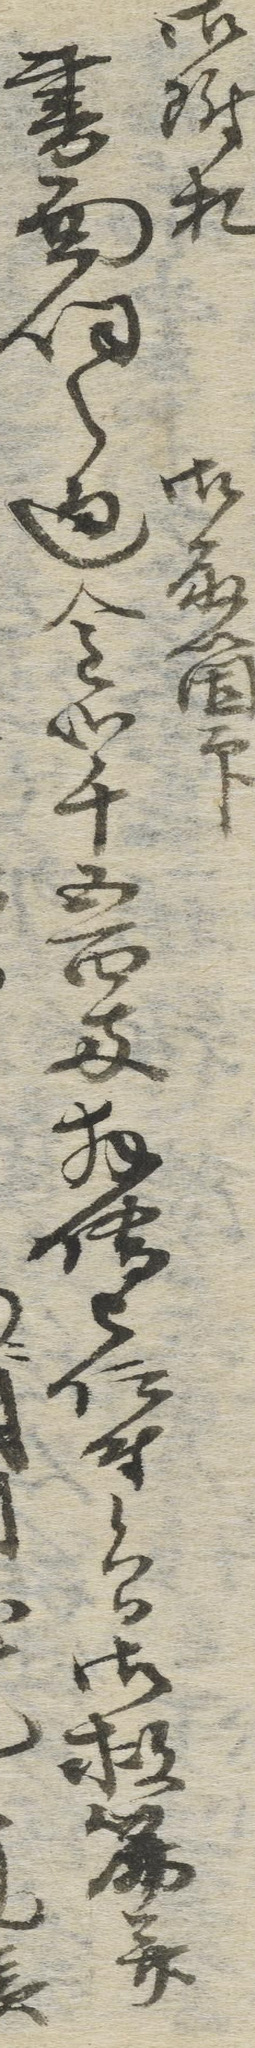書面伺之通金千五百両拝借被仰付候間御救筋并
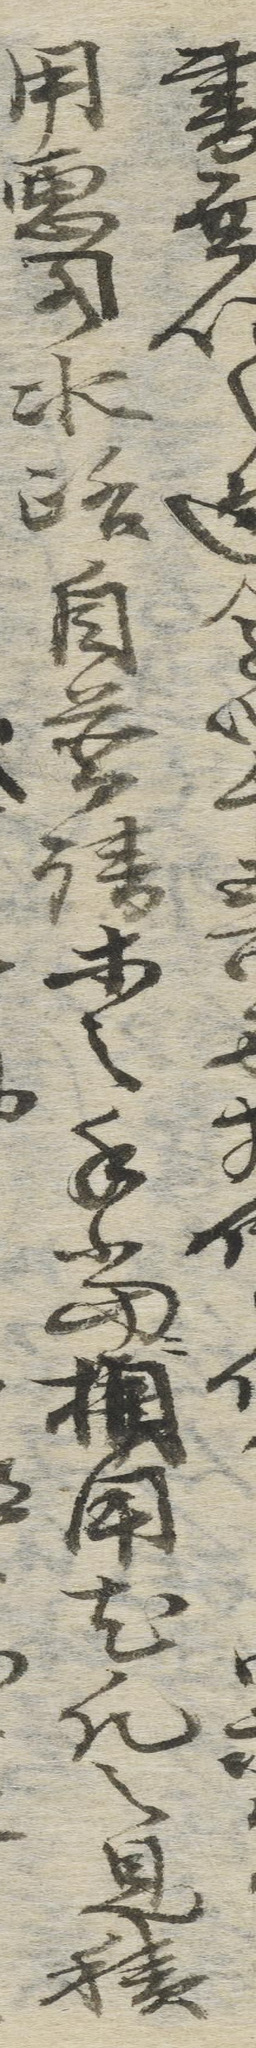用悪用水路自普請等之手当二相用尤凡之見積
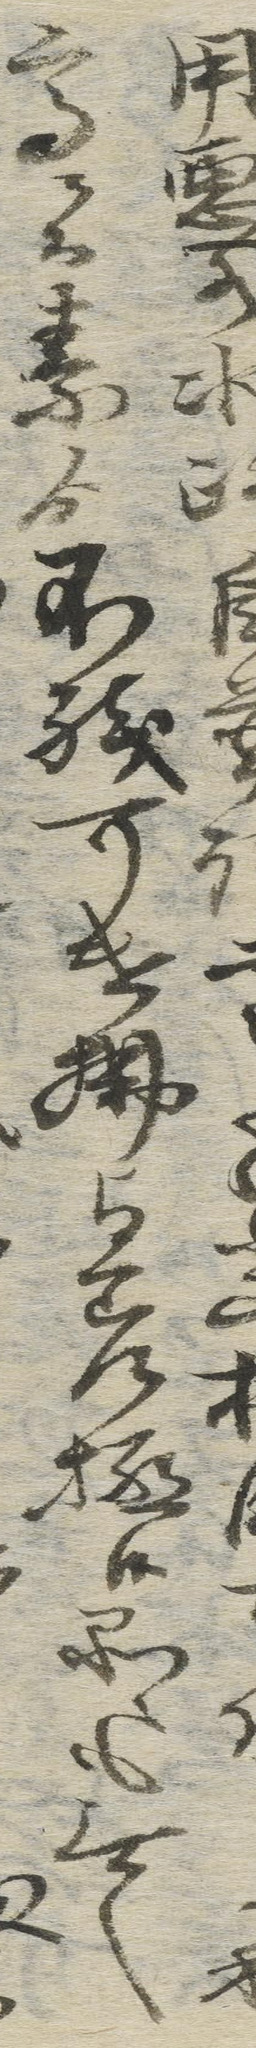高二而素ゟ不残可遣払と差極候品々二も無之
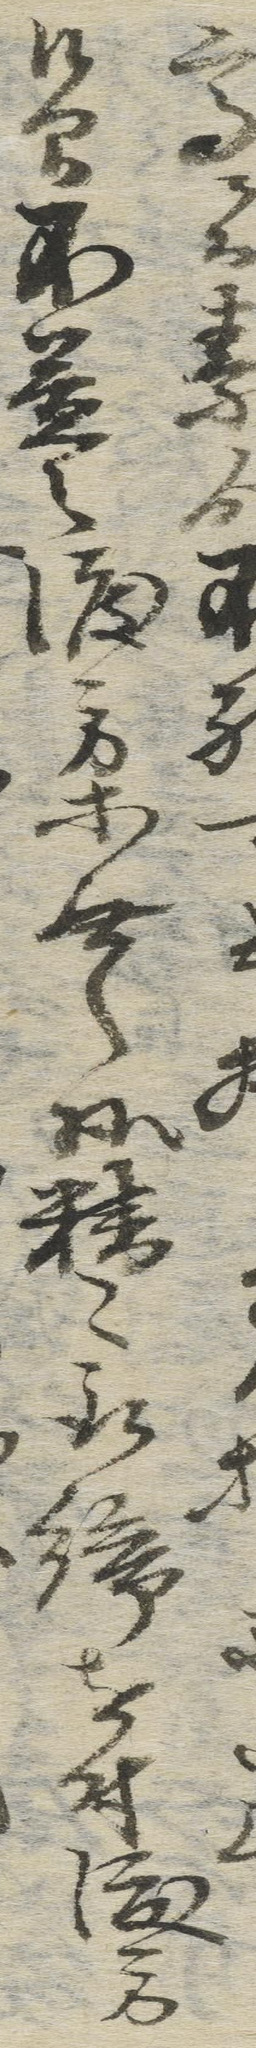候間不益之渡方等無之様精々取締を付渡方
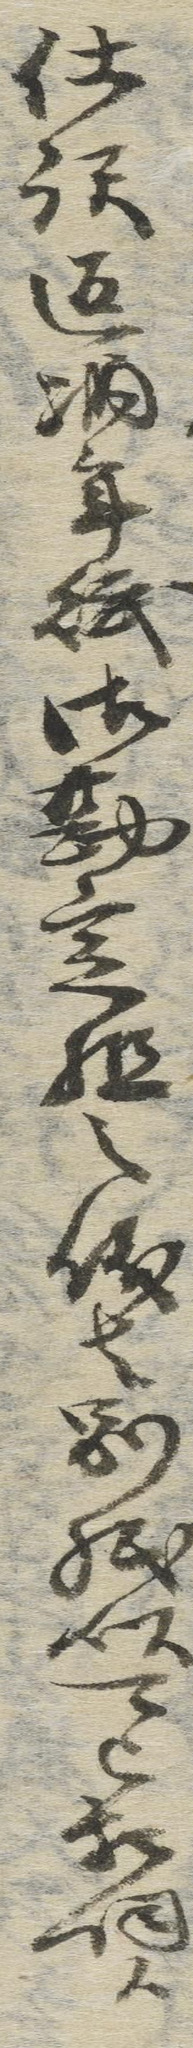仕訳返済年賦御勘定組之儀は別紙以可被相調候
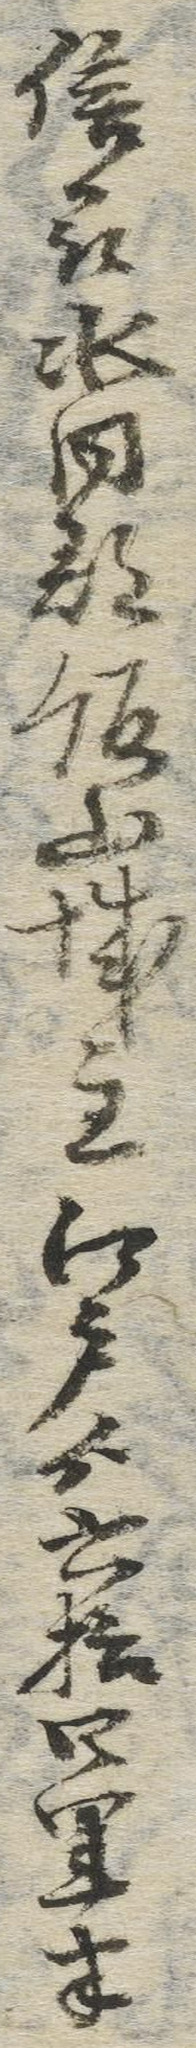信州水内郡飯山城主江戸ゟ六拾四里半
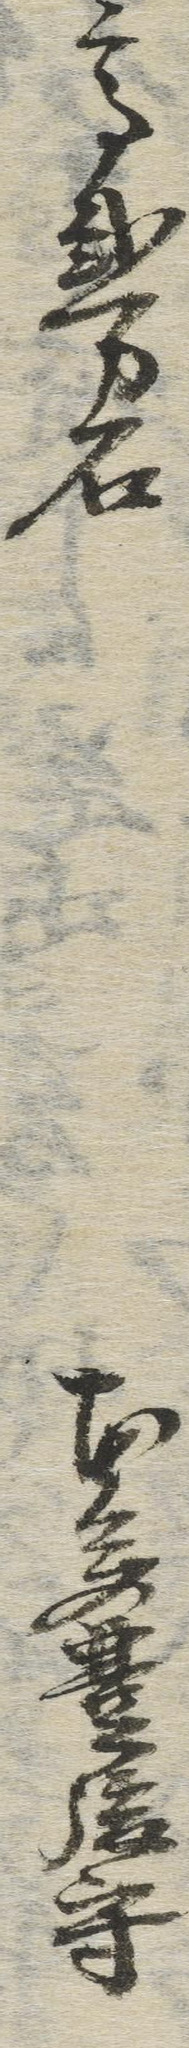高弐万石本多豊後守
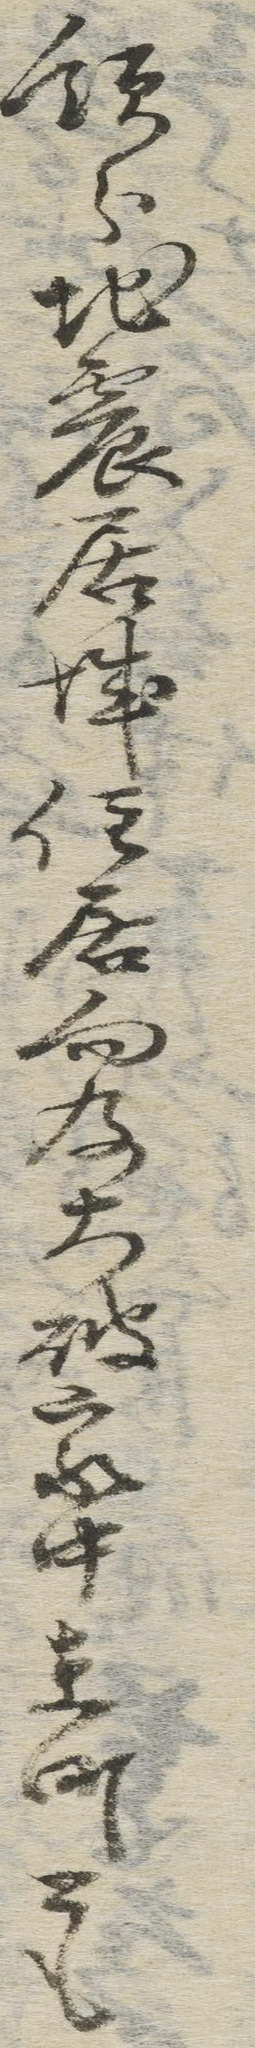領分地震居城住居向及大破家中在町二も
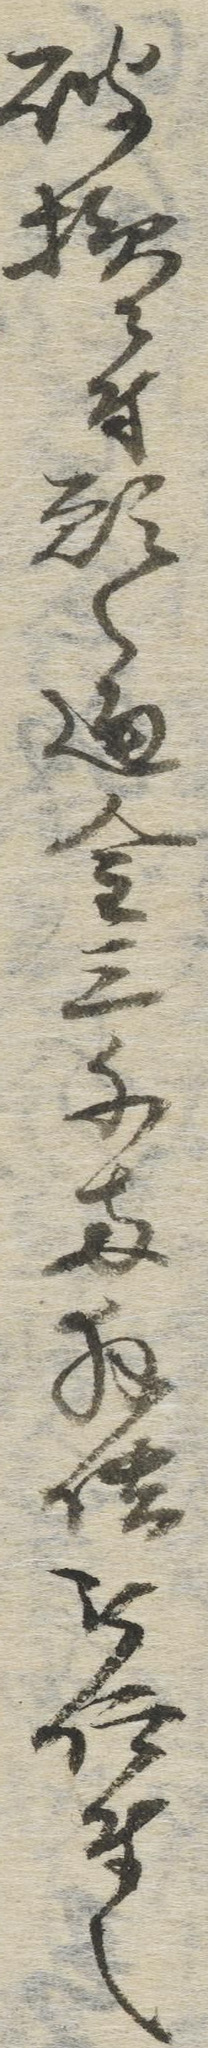破損二付願之通金三千両拝借被仰付之
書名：信濃越後　地震書留
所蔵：東京大学地震研究所図書室 Earthquake Research Institute Library, The University of Tokyo, JAPAN
